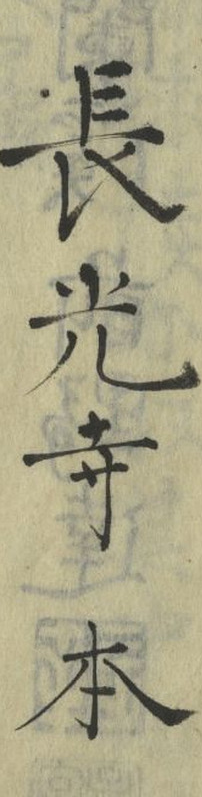長光寺本
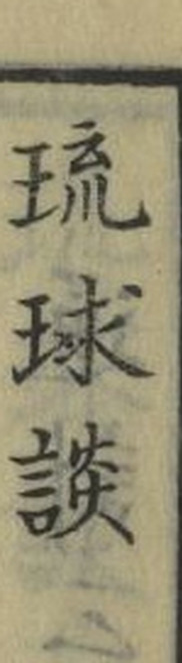琉球談
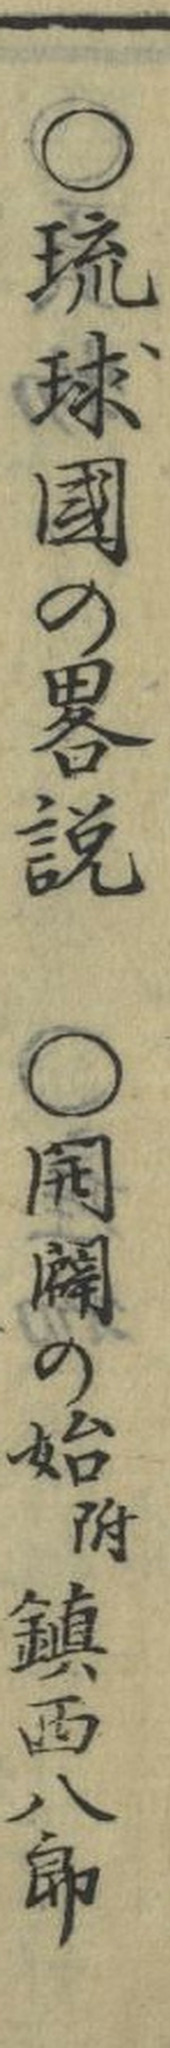◯琉球國の略説◯開閉の始附鎮西八郎
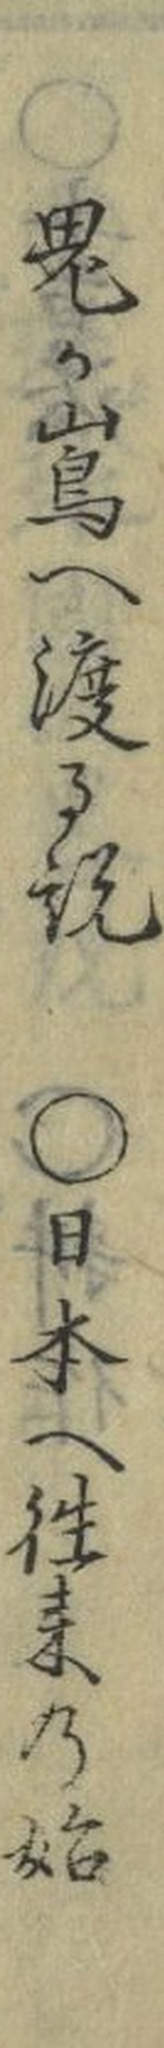鬼か島へ渡る説◯日本へ往来の始
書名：琉球談
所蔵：University of the Ryukyus Library
